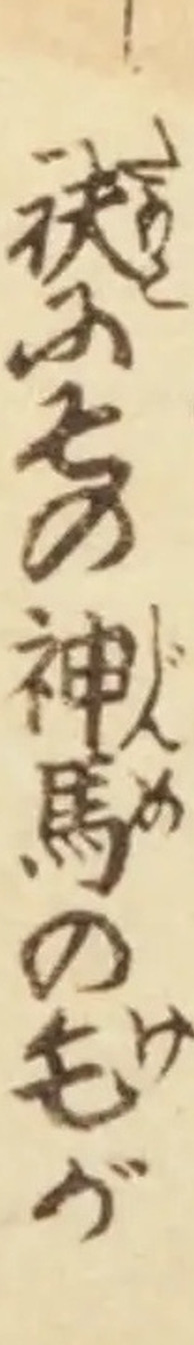袂にその神馬の毛が
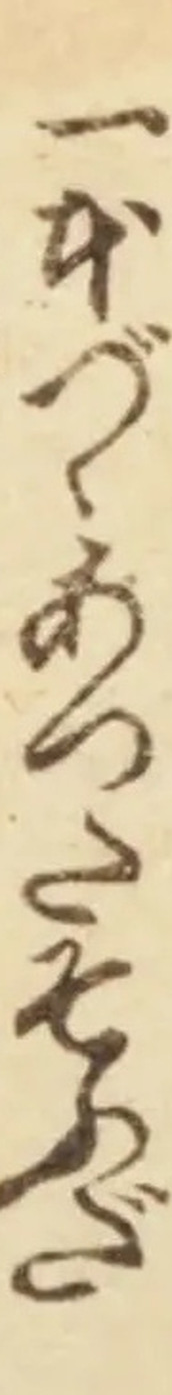一本づゝあつたそふだ
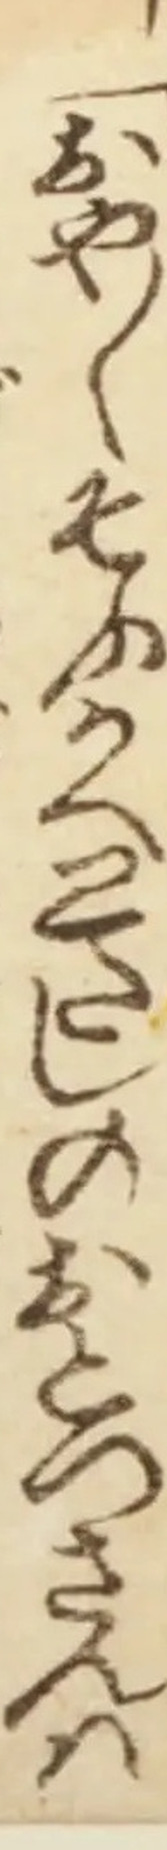〽おや〳〵そふかへわたしのおとつさんは
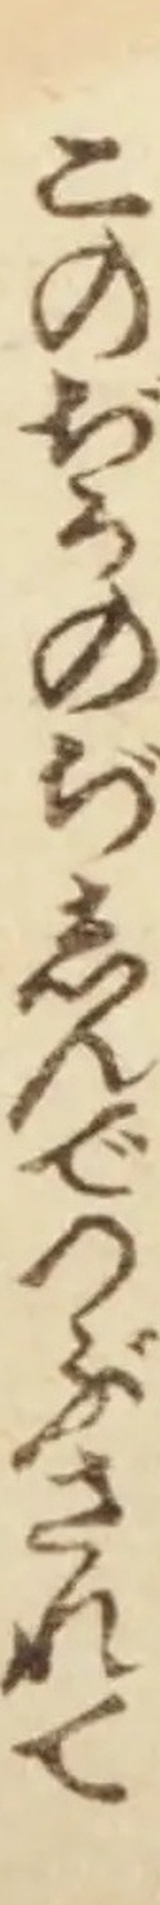このぢうのぢしんでつぶされて
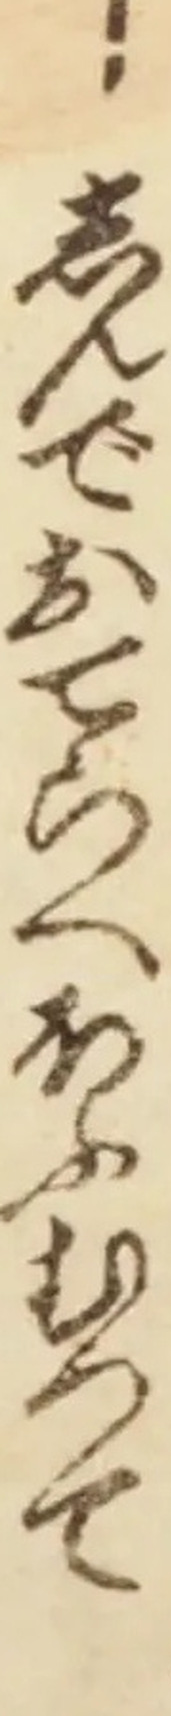しんでおてらへほふむつて
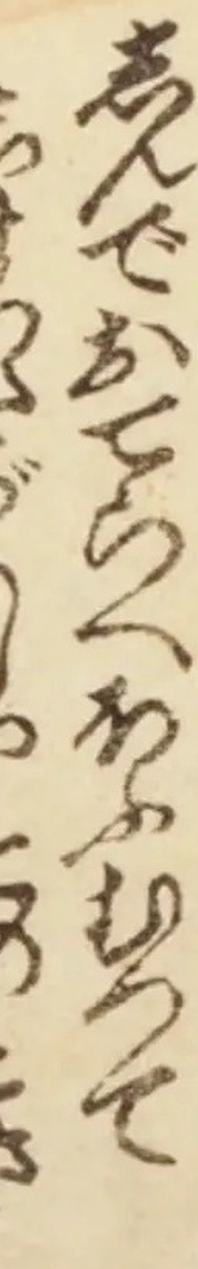しんでおてらへほふむつて
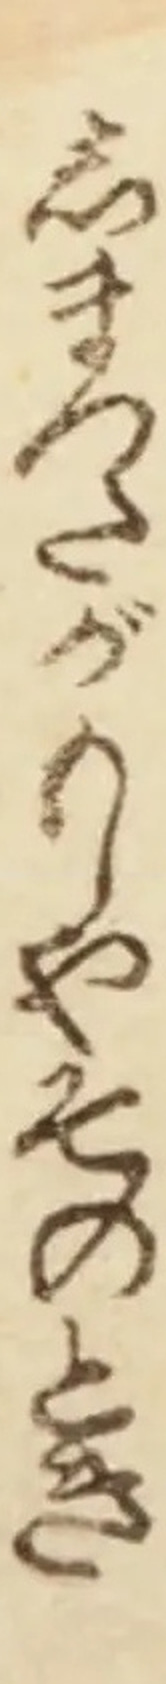しまつたがもしやそのとき
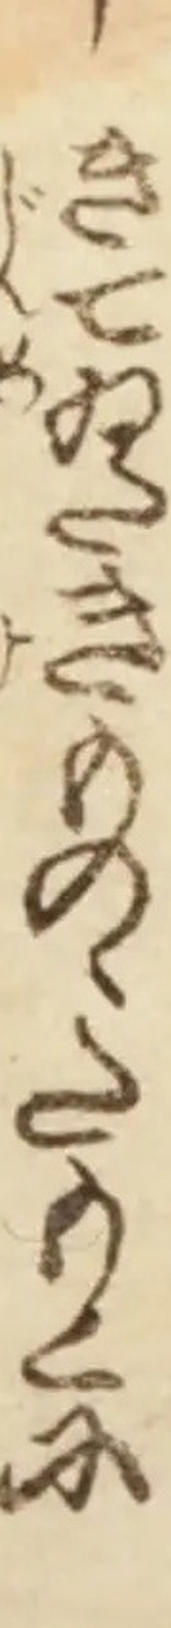きてゐたきものゝたもとに
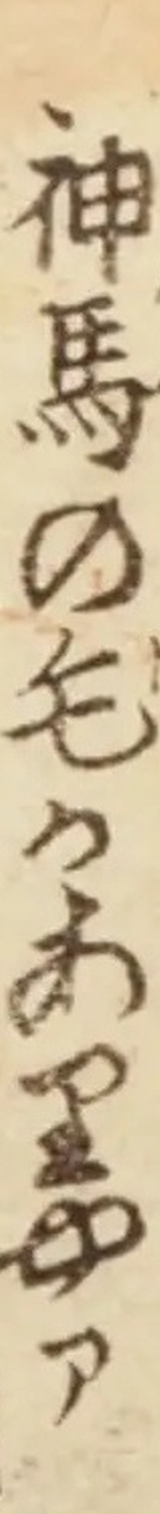神馬の毛がありやア
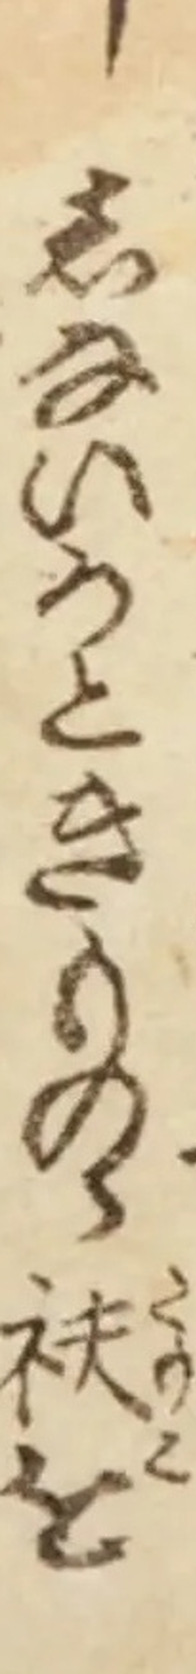しないかときものゝ袂を
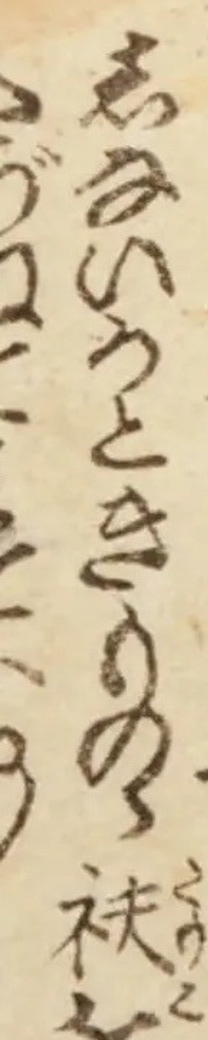しないかときものゝ袂を
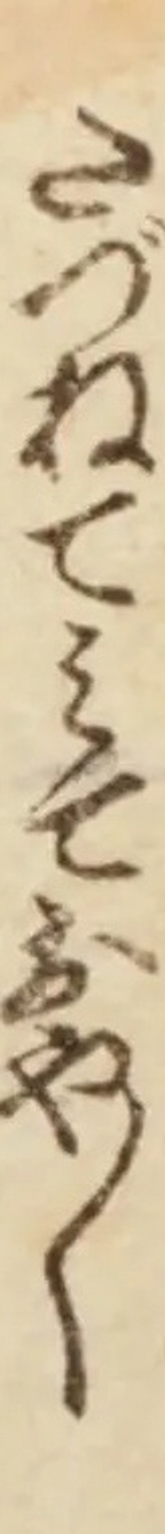たづねてみておや〳〵
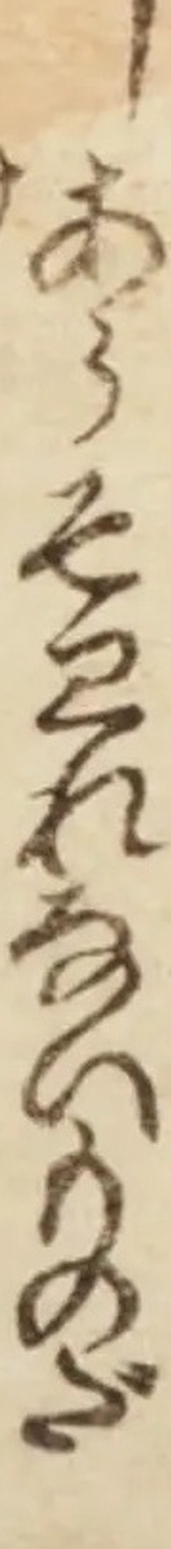あらそわれないものだ
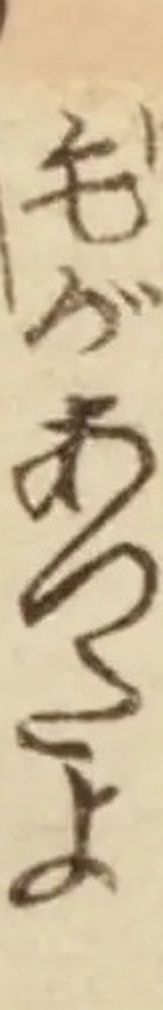毛があつたよ
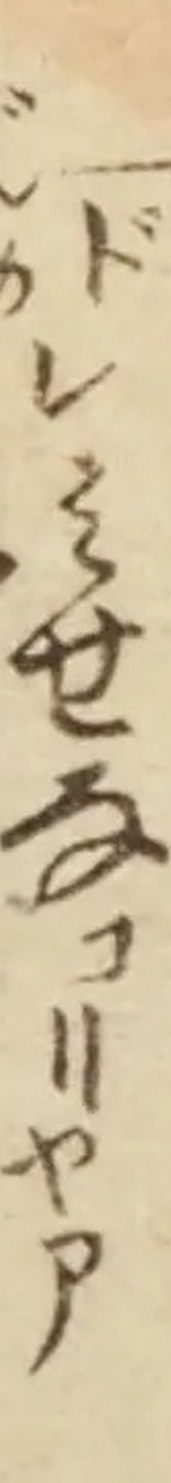〽ドレみせなコリヤア
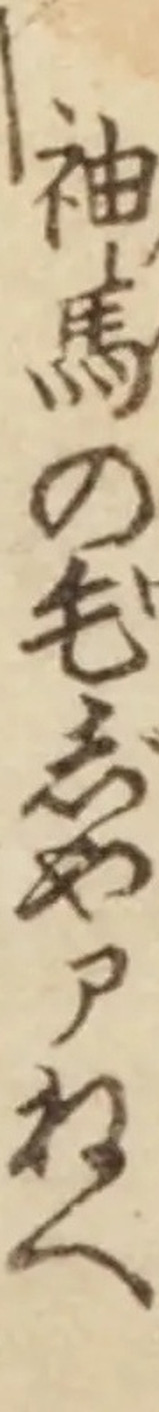神馬の毛じやアねへ
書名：二日はなし地震亭念魚町々庵炎上
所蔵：国立国会図書館 National Diet Library, JAPAN
